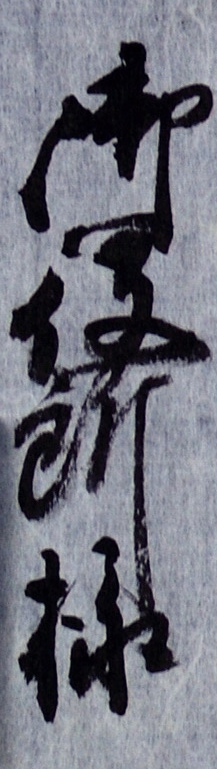御役所様
